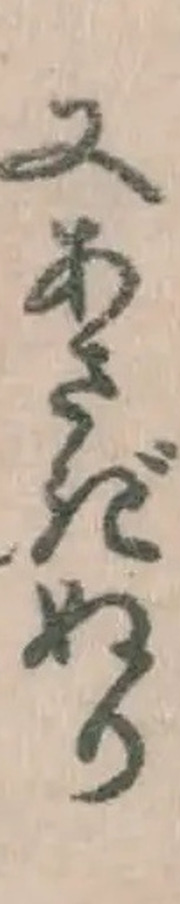又あさぎぬり
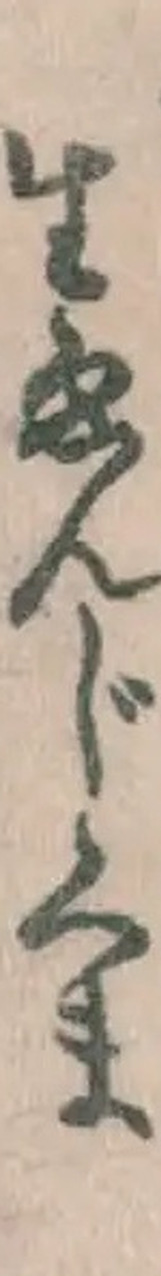生ゑんじくま
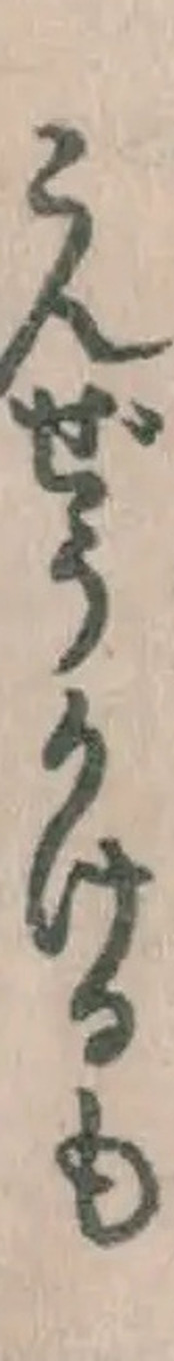こんぜうかけるも

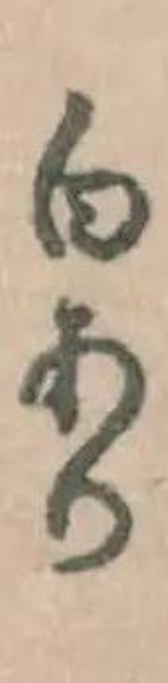白あり
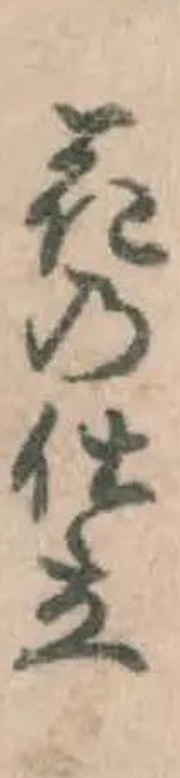花の仕立
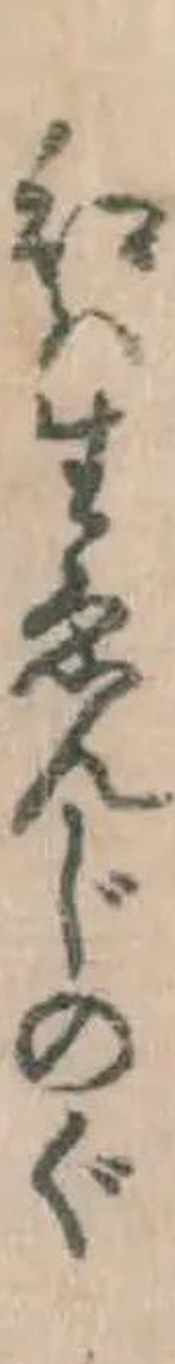紅は生ゑんじのぐ
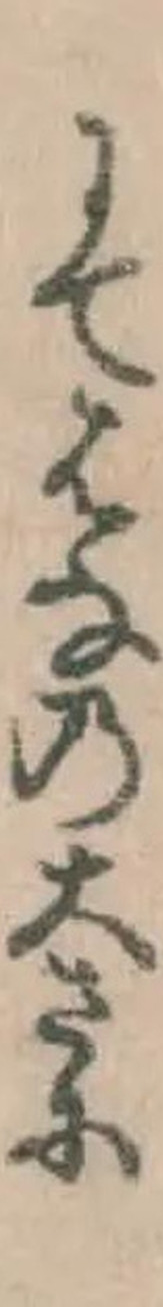にてはなの大さに
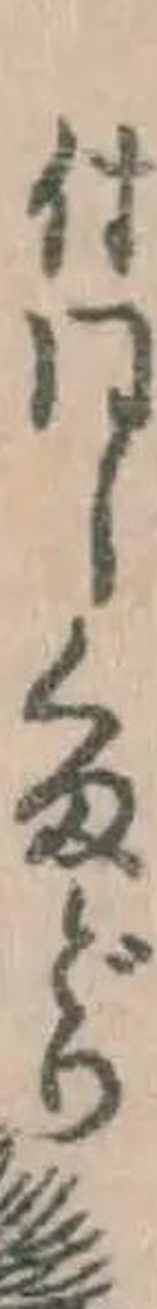付同しくまどり
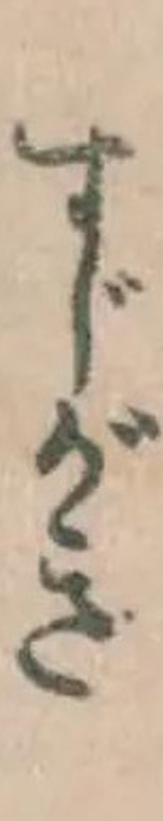すじがき
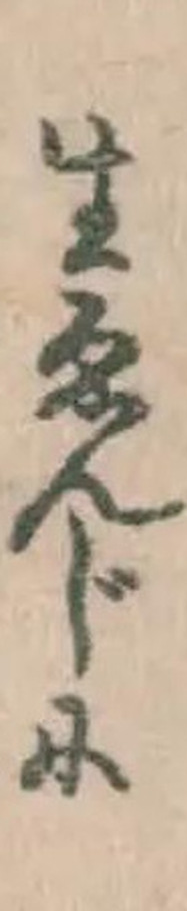生ゑんじに
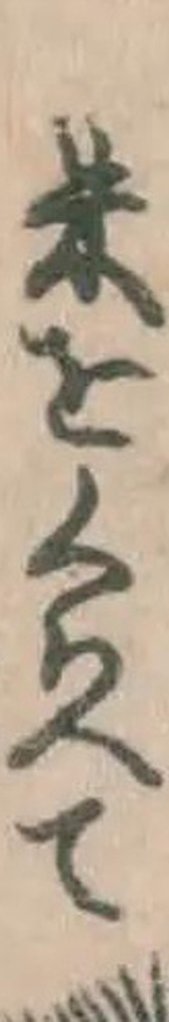朱をくわへて
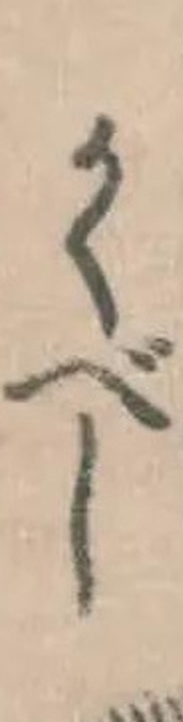かくべし
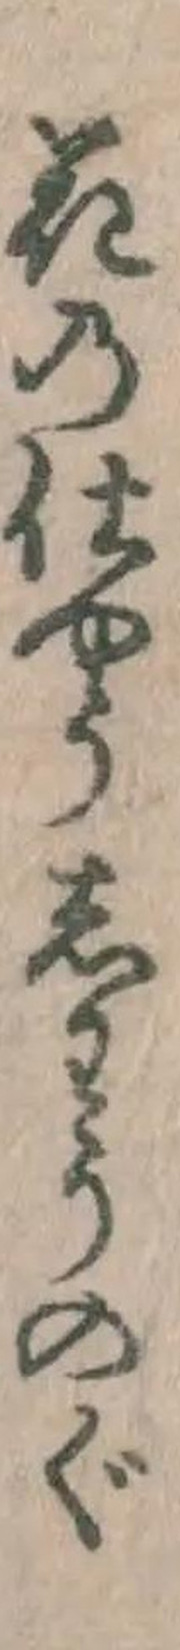花の仕やうしわうのぐ
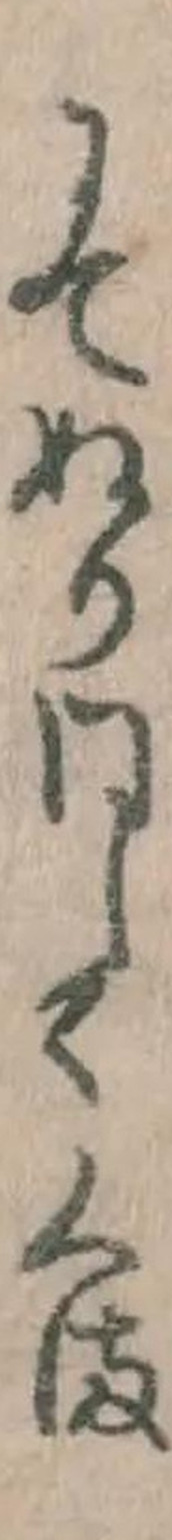にてぬり同しくくま
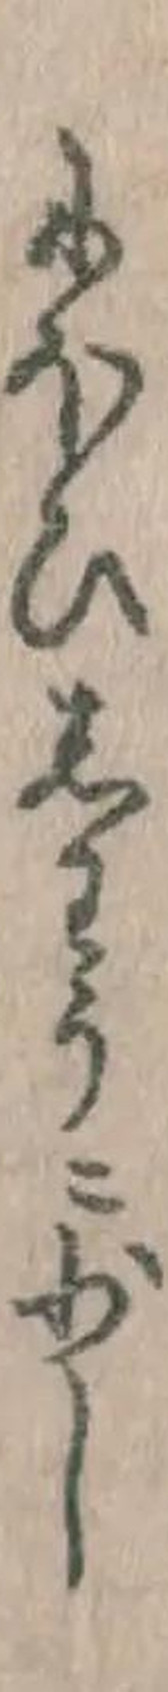にほひしわうに少し
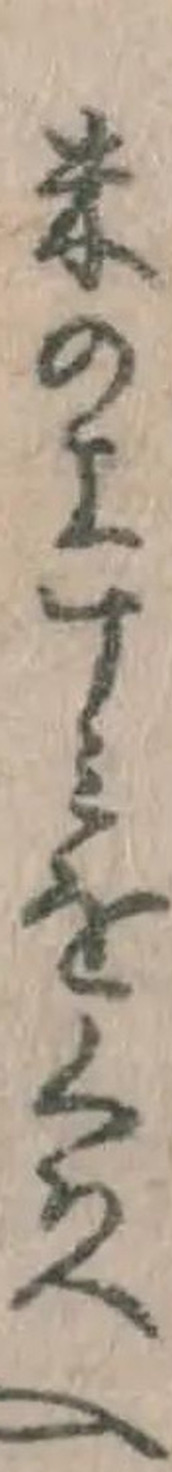朱の上すみをくわへ
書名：絵本時津艸
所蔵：国立国会図書館 National Diet Library, JAPAN
